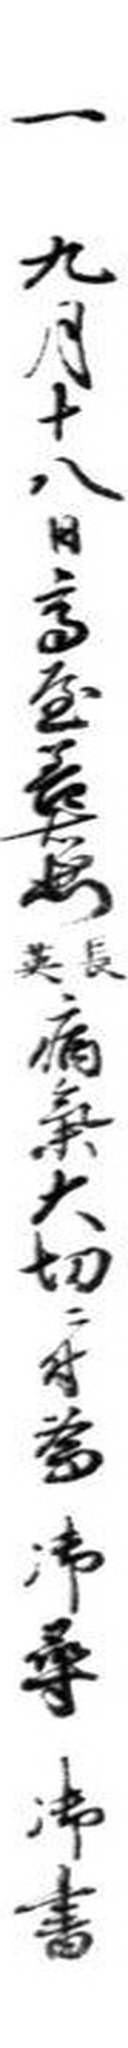一九月十八日高屋善右衛門長英病気大切ニ付為御尋御書
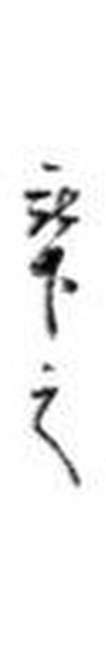被下之
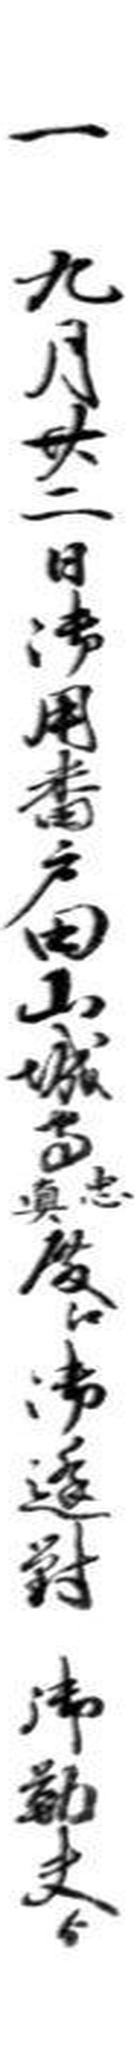一九月廿二日御用番戸田山城守忠真殿江御逢対
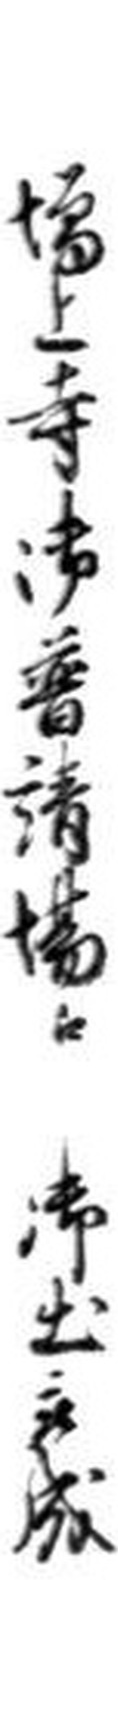増上寺御普請場江御出被成
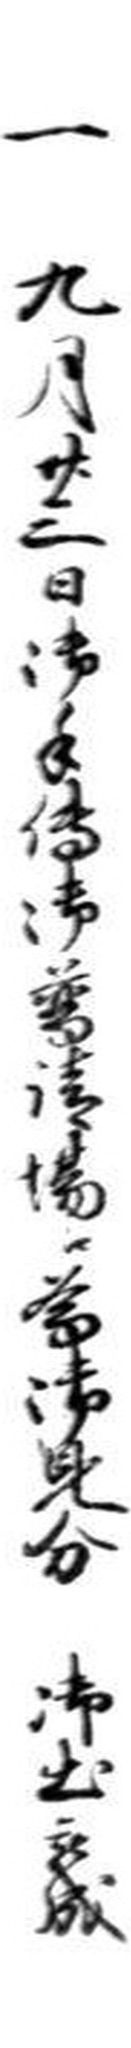一九月廿三日御手伝御普請場江為御見分御出被成
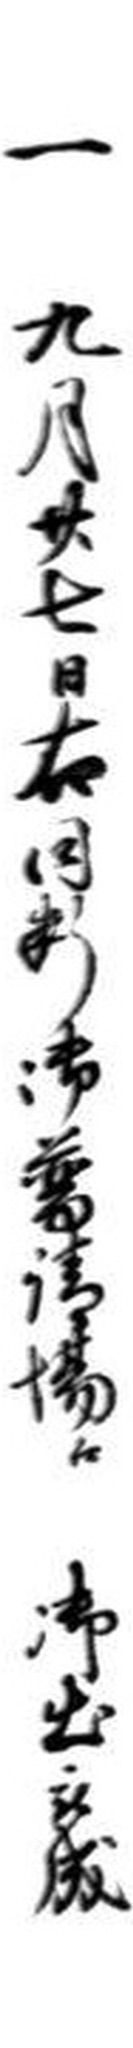一九月廿七日右同断御普請場江御出被成
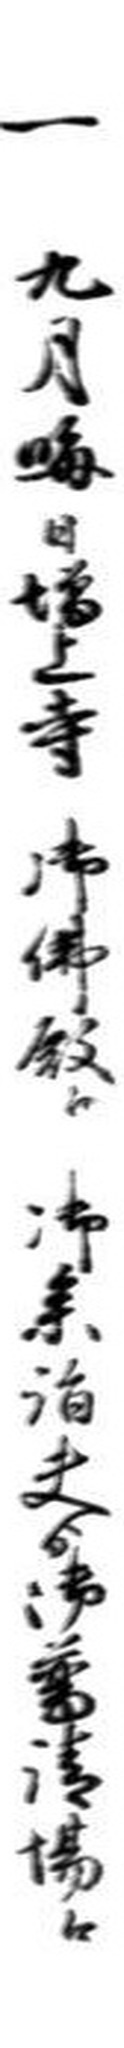一九月晦日増上寺御仏殿江御参詣夫ゟ御普請場江
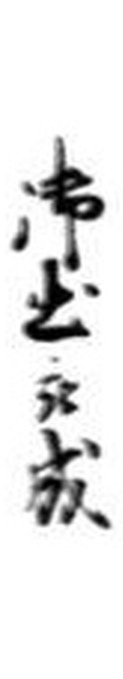御出被成
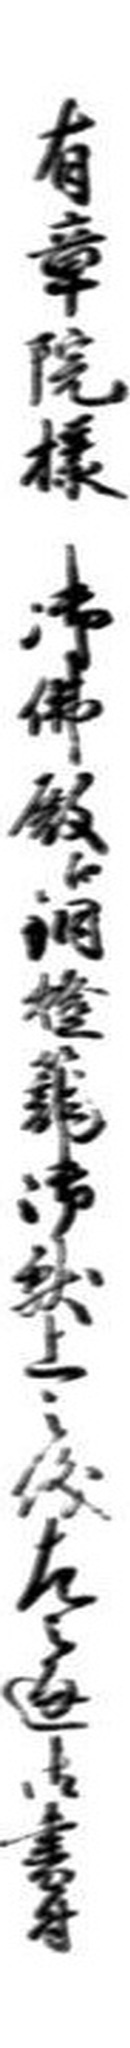有章院様御仏殿江銅燈籠御献上之儀左之通御書付
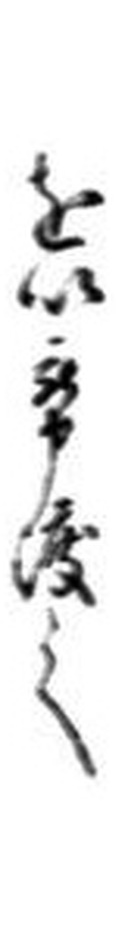を以被申渡之
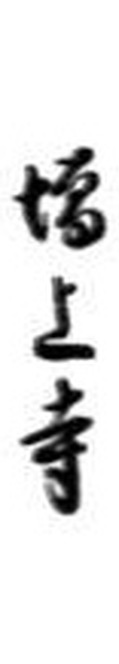増上寺
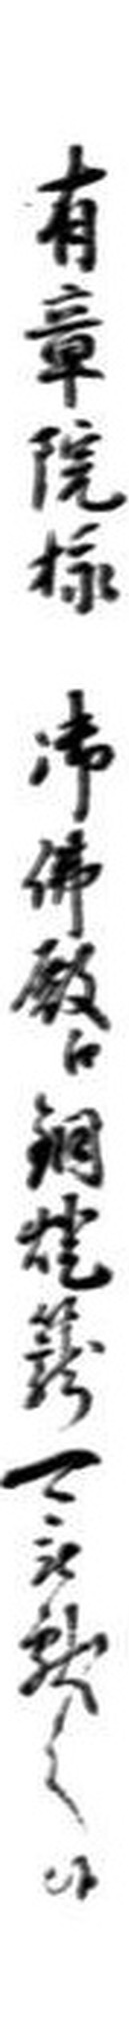有章院様御仏殿江銅燈籠可被献之候
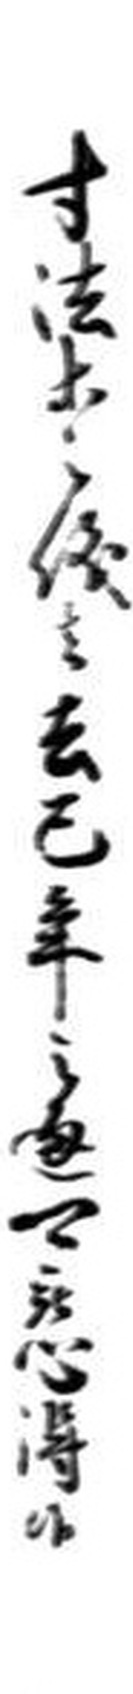寸法等之儀者去巳年之通可被心得候
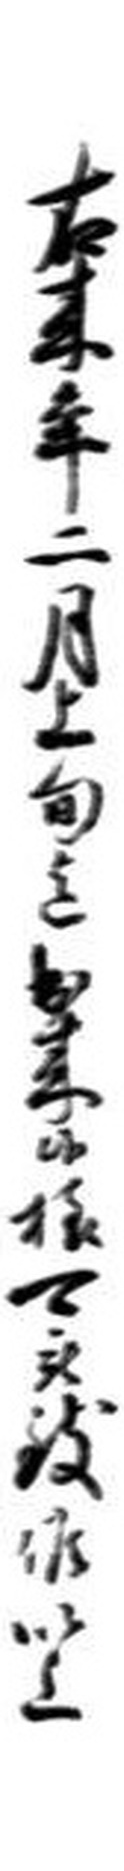右来年二月上旬迄出来候様可被致候以上

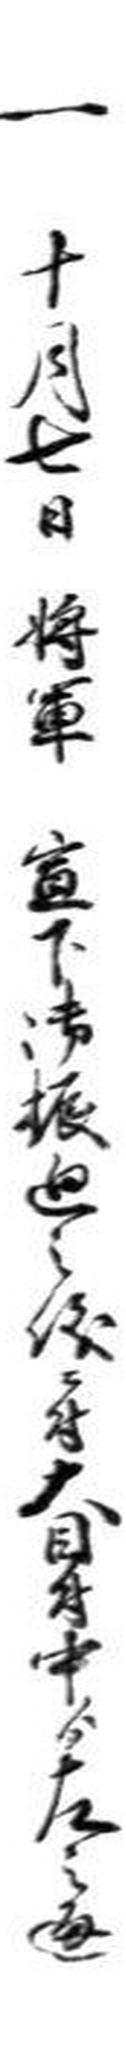一十月七日将軍宣下御振廻之儀ニ付大目付中ゟ左之通
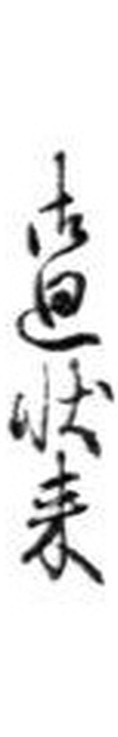御廻状来
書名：家譜 三十一 吉邦公 享保元年
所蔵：福井県文書館 Fukui Prefectural Archives
